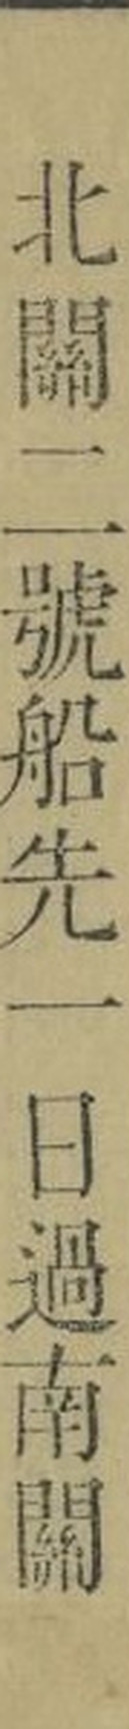北關二號船先一日過南關
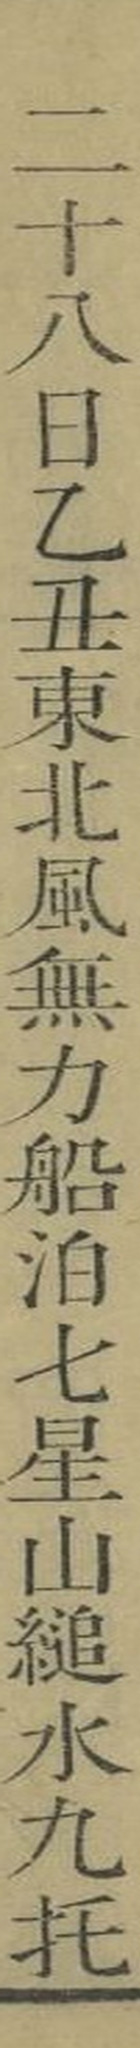二十八日乙丑東北風無力船泊七星山縋水九托
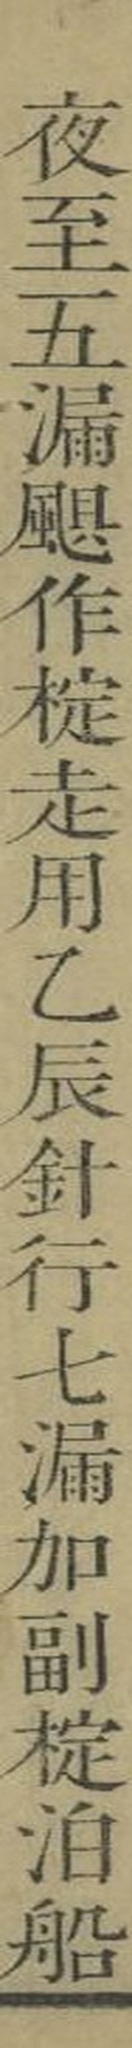夜至五漏颶作椗走用乙辰針行七漏加副椗泊船
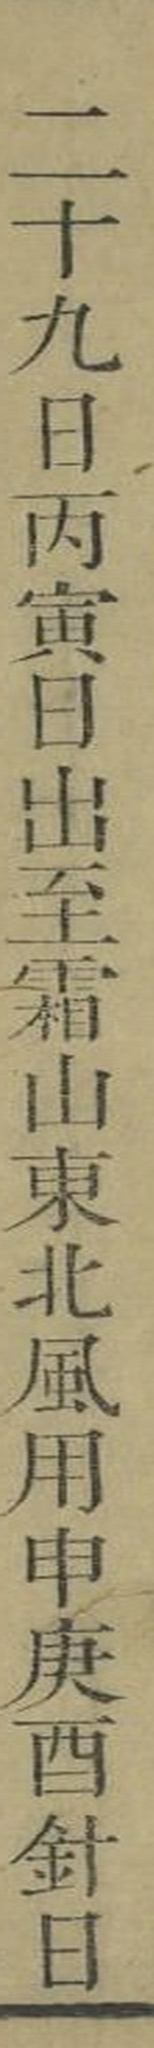二十九日丙寅日出至霜山東北風用申庚酉針日
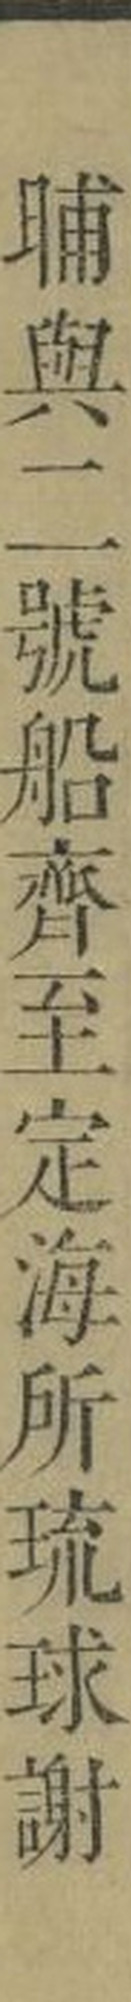晡與二號船齊至定海所琉球謝
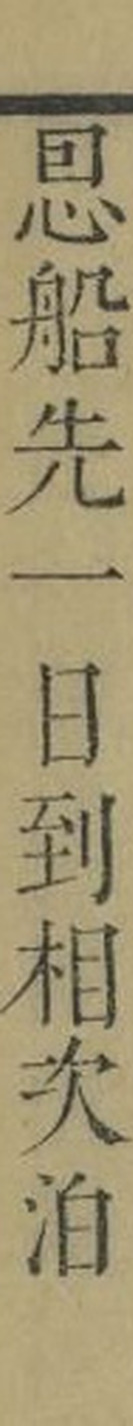㤙船先一日到相次泊

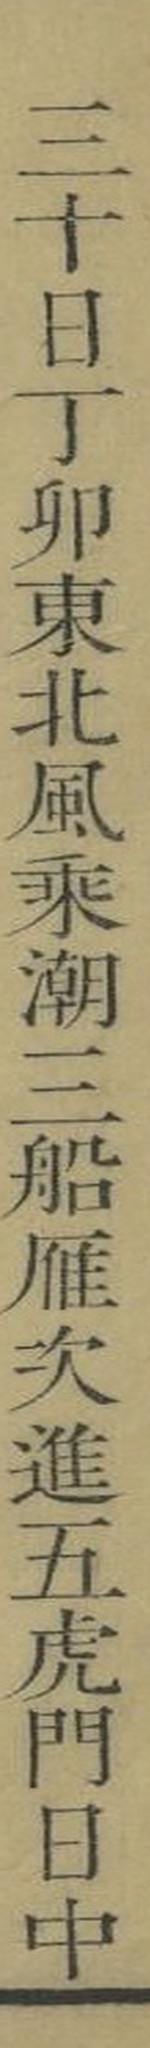三十日丁卯東北風乘潮三船雁次進五虎門日中
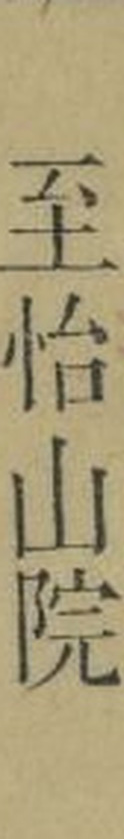至怡山院
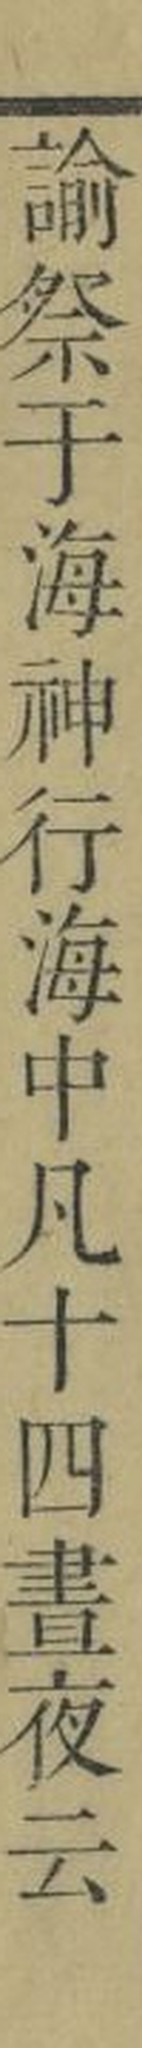諭祭于海神行海中凡十四晝夜云
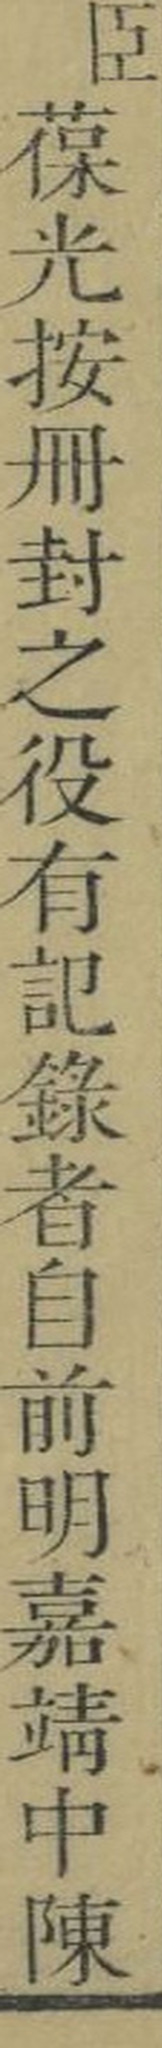臣葆光按冊封之役有記錄者自前明嘉靖中陳
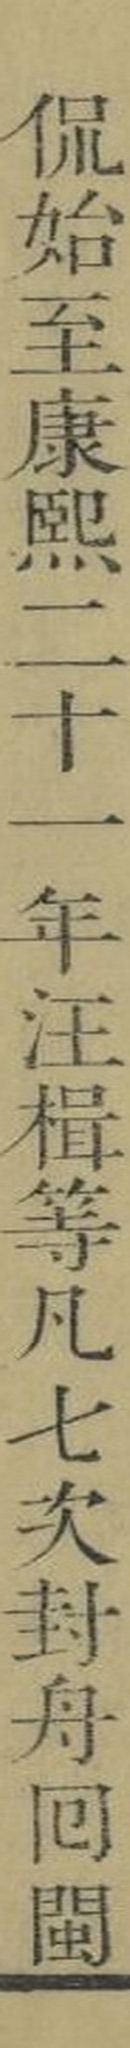侃始至康熙二十一年汪楫等凡七次封舟囘閩
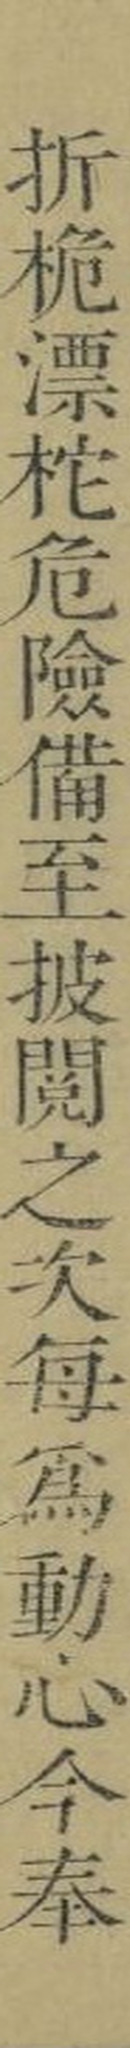折桅漂柁危險備至披閲之次每爲動心今奉
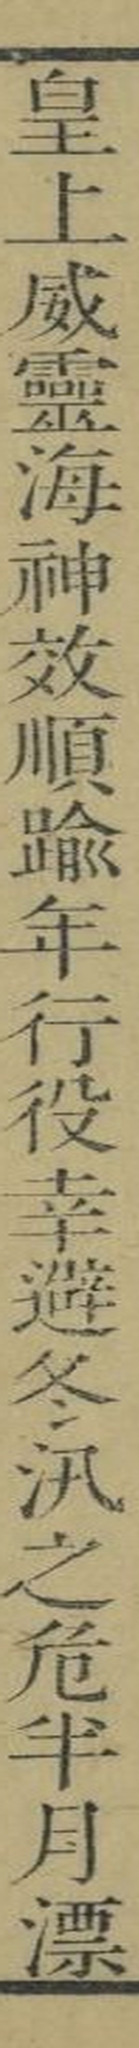皇上威靈海神效順踰年行役幸避冬汛之危半月漂
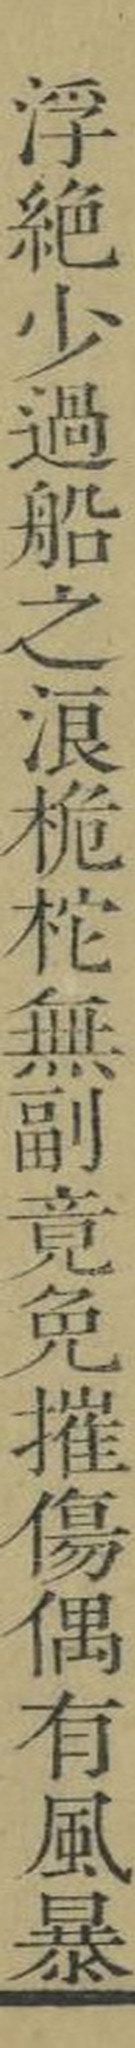浮絶少過船之浪桅柁無副竟免摧傷偶有風暴
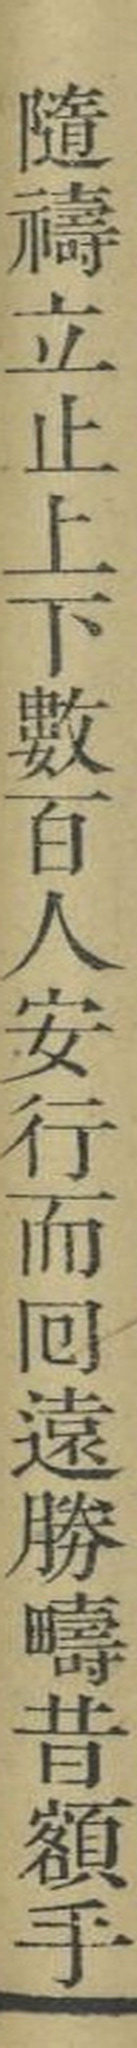隨禱立止上下數百人安行而囘遠勝疇昔額手
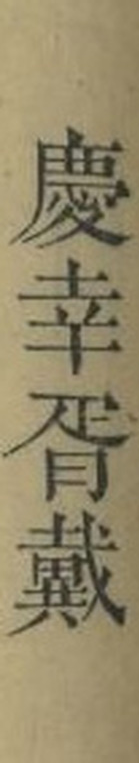慶幸胥戴
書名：中山伝信録 巻一
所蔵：University of the Ryukyus Library
